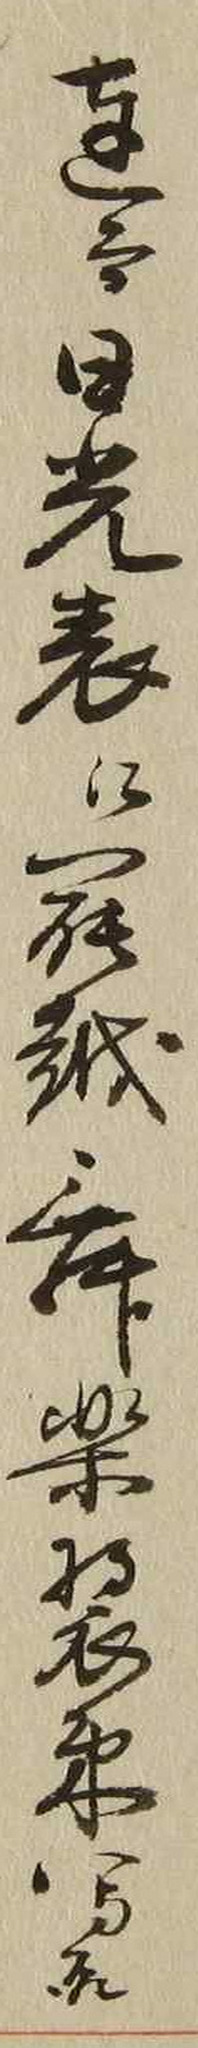達而日光表江罷越舞楽装束写取
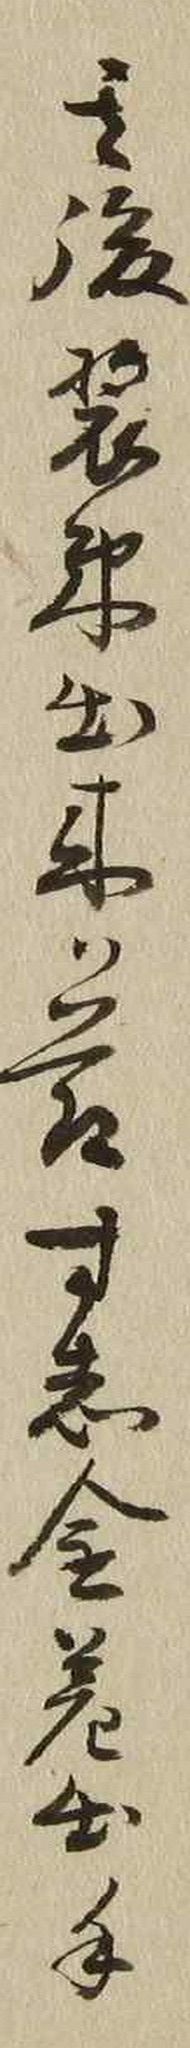其後装束出来候節寸志金差出手
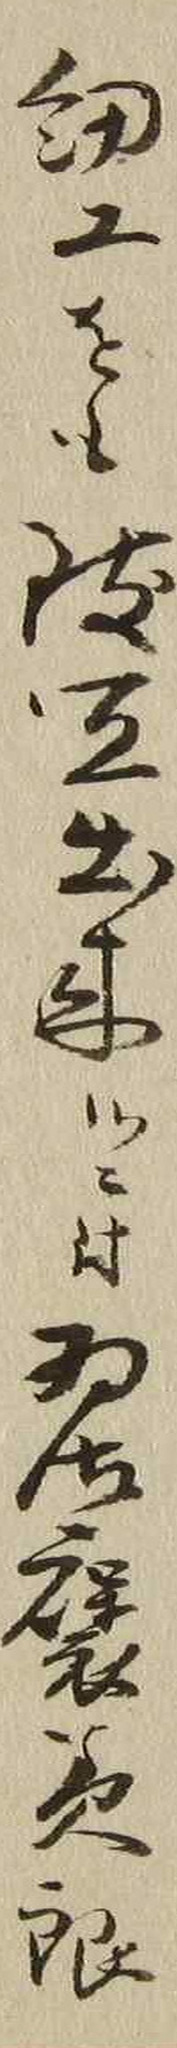細工をも致宜出来候ニ付為御褒美銀
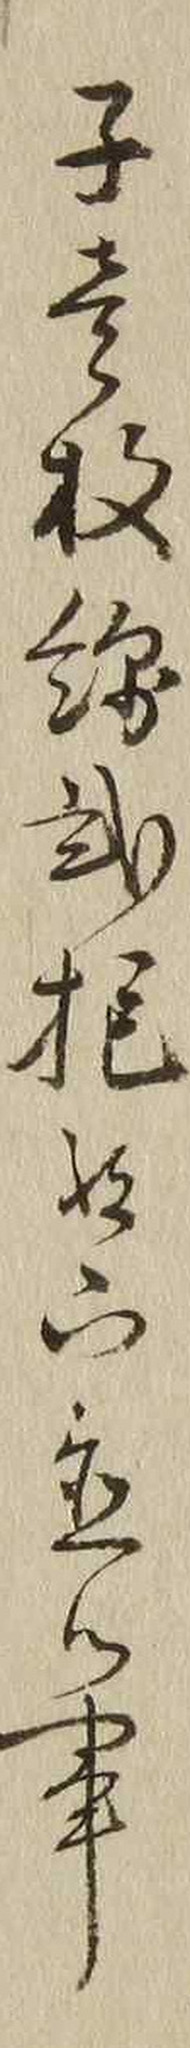子壱枚綿弐把被下置候事
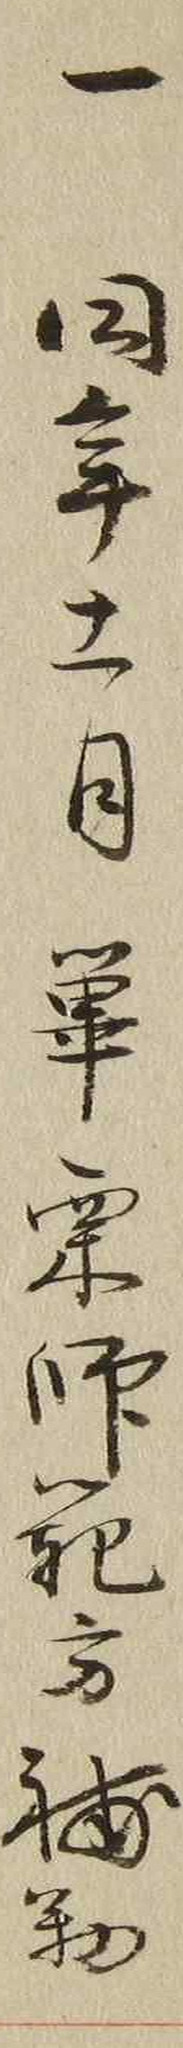一同年十一月、篳栗師範方補勤
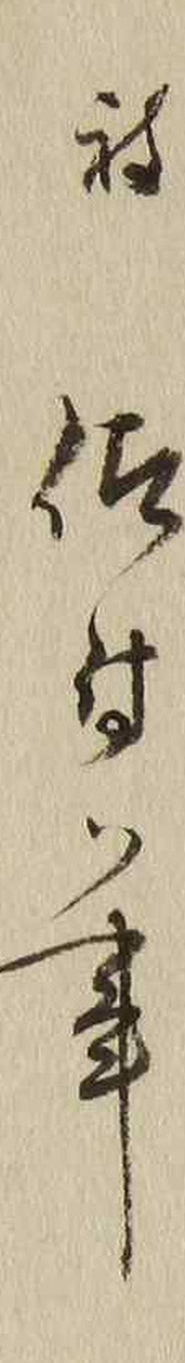被仰付候事
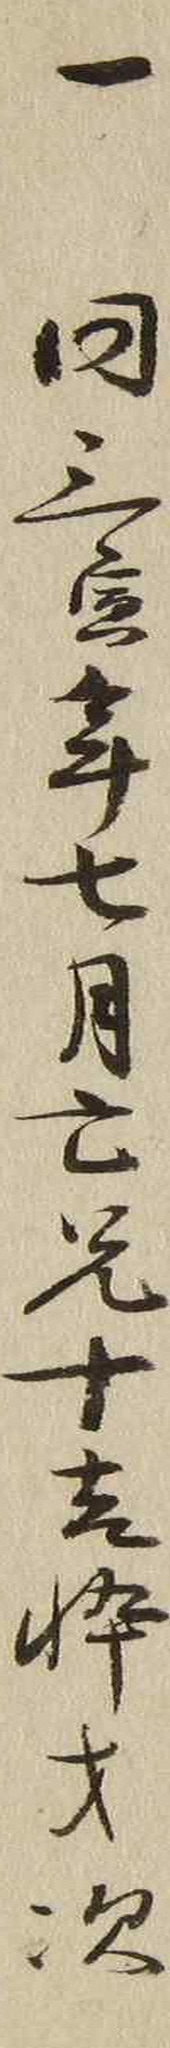一同三寅年七月亡兄十吉忰才次
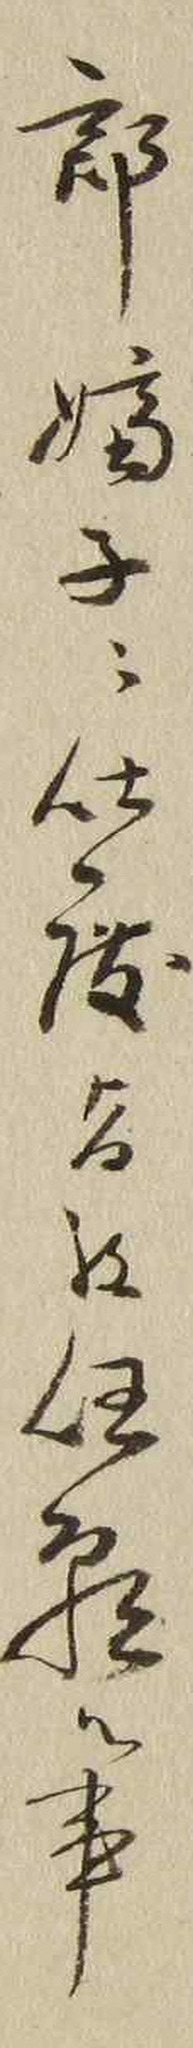郎嫡子ニ仕度旨被任願候事
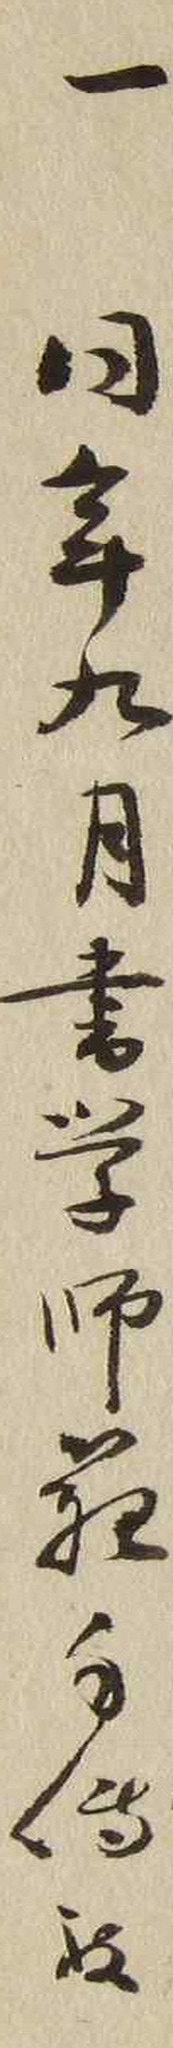一同年九月書学師範手伝被
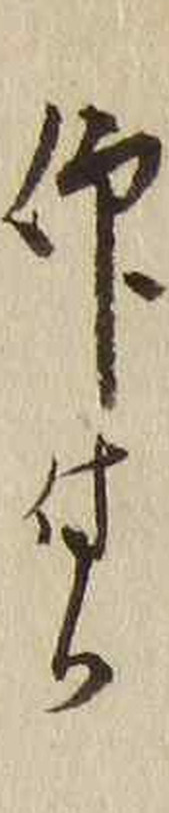仰付候

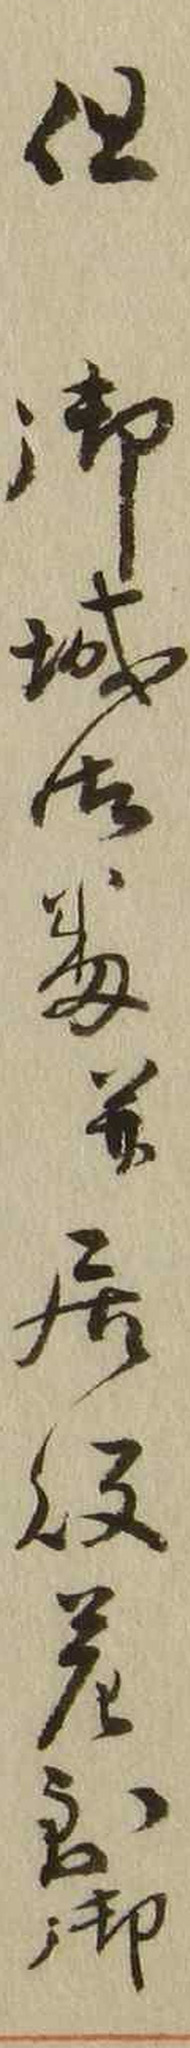但御城御番并居役差置到御
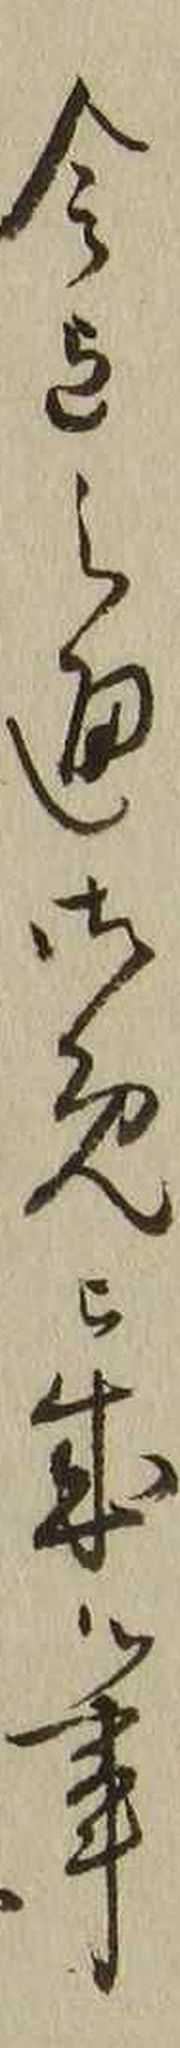今迄之通御免被成候事
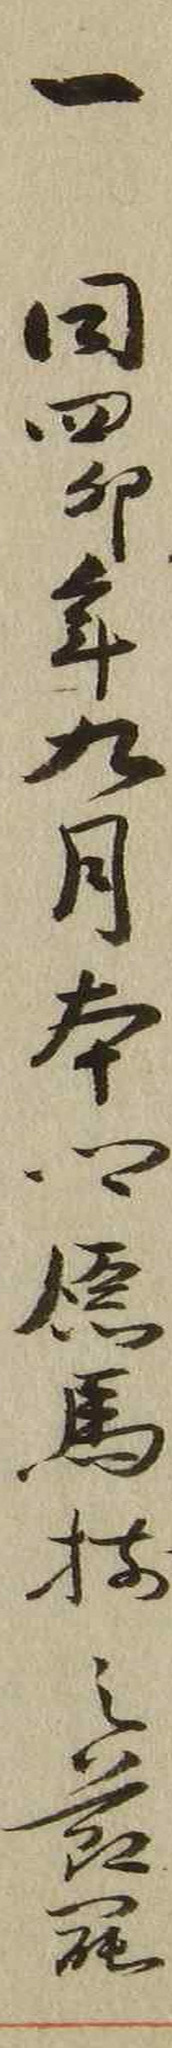一同四卯年九月本郷原馬揃之節罷
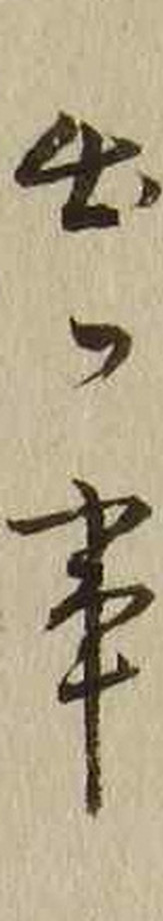出候事
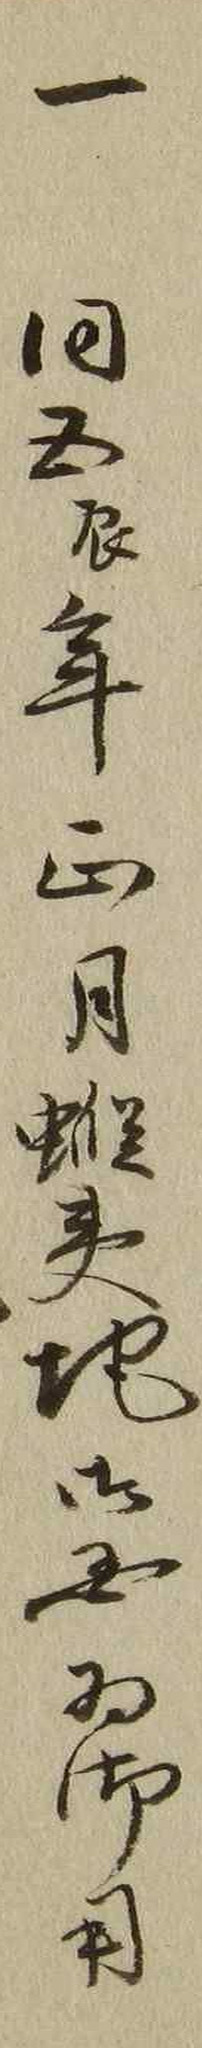一同五辰年正月蝦夷地御固為御用
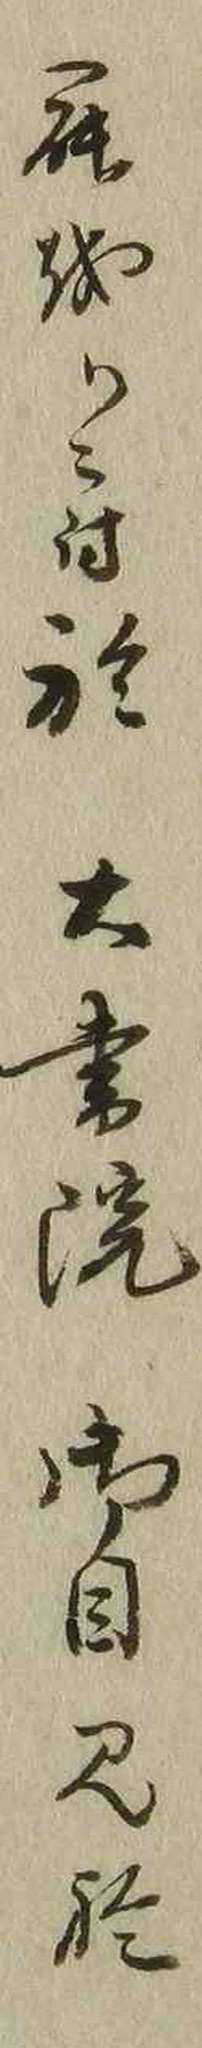罷越候ニ付於大書院御目見於
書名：諸士系譜　巻之221　ま之部2
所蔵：会津若松市立会津図書館
